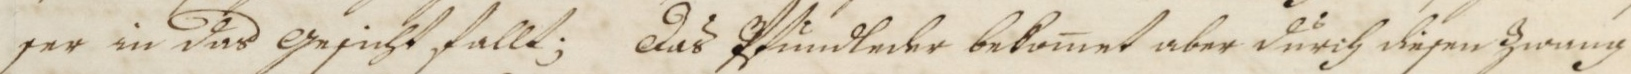ser in das Gesicht fallt. Das Pfundleder bekommet aber durch diesen Zwang
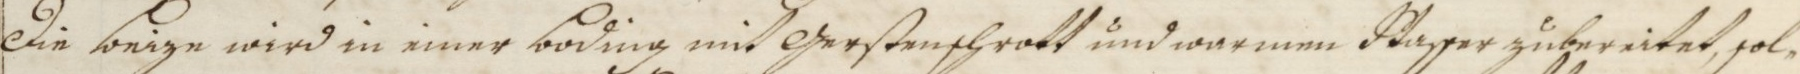Die Beize wird in einer Boding mit Gerstenschrott und warmen Wasser zubereitet, sol-
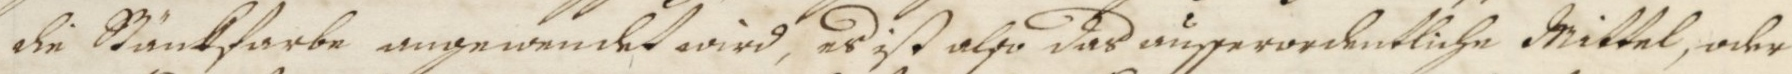die Stänkfarbe angewendet wird, es ist also das ausserordentliche Mittel, oder
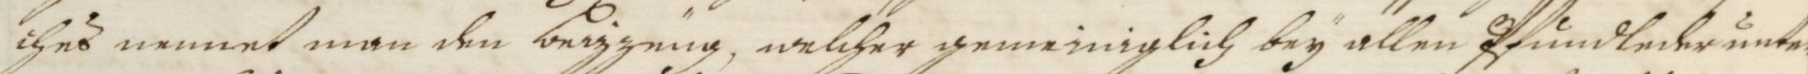ches nennet man den Beizzeüg, welcher gemeiniglich bey allen Pfundleder unter
